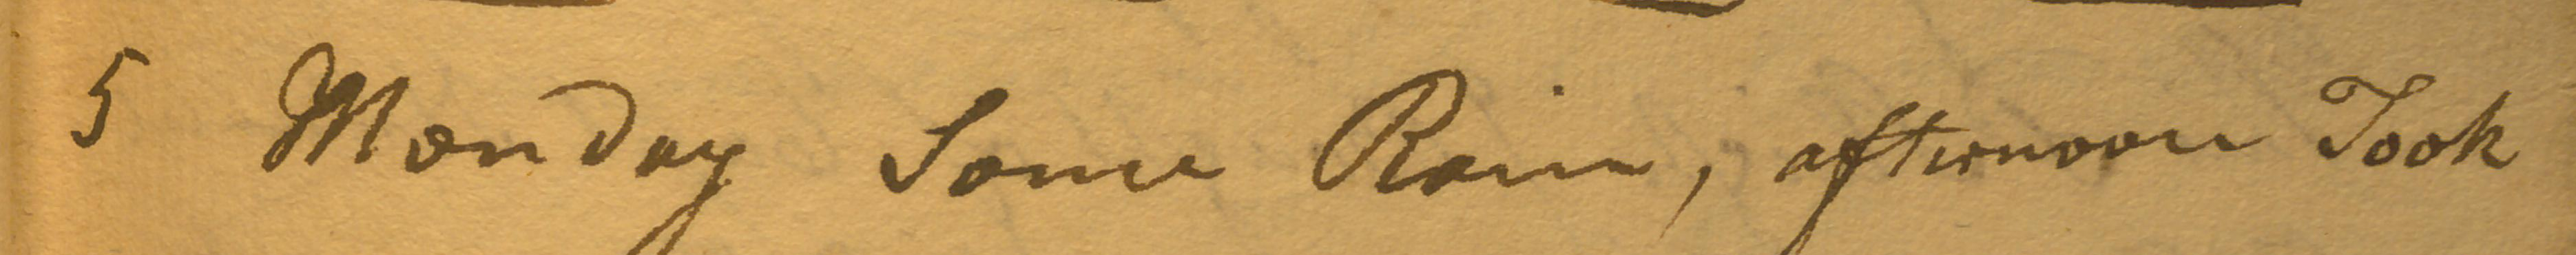5 Monday Some Rain, afternoon Took
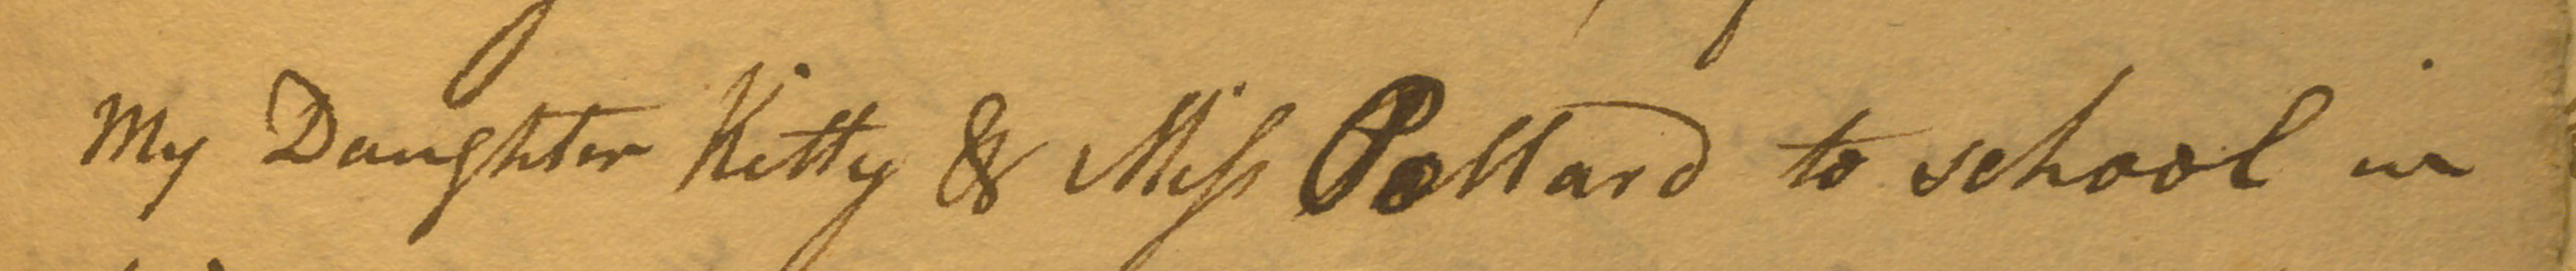My Daughter Kitty & Miss Pollard to school in
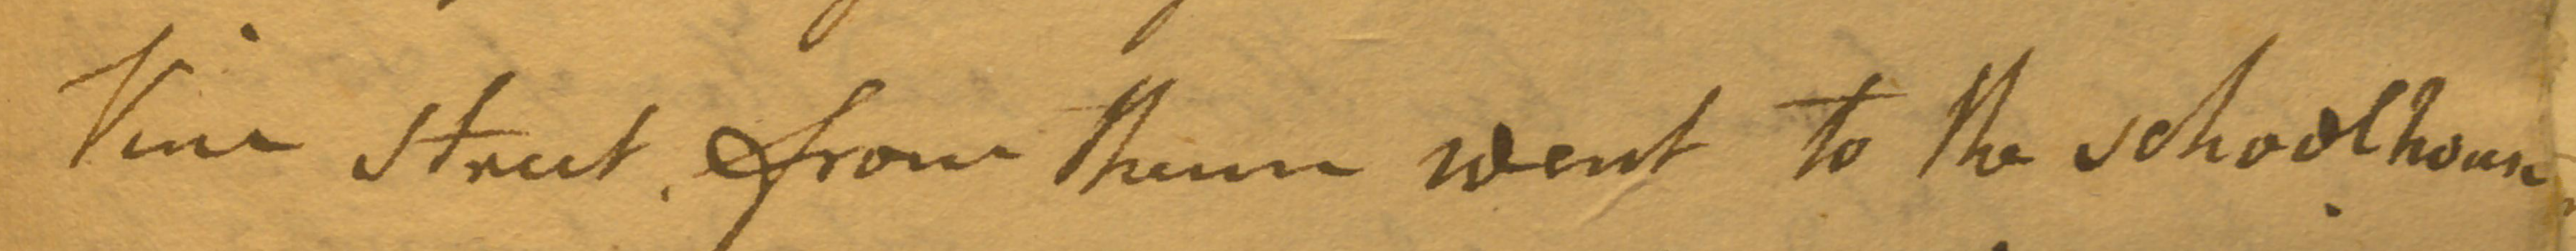Vine Street from thence went to the schoolhouse
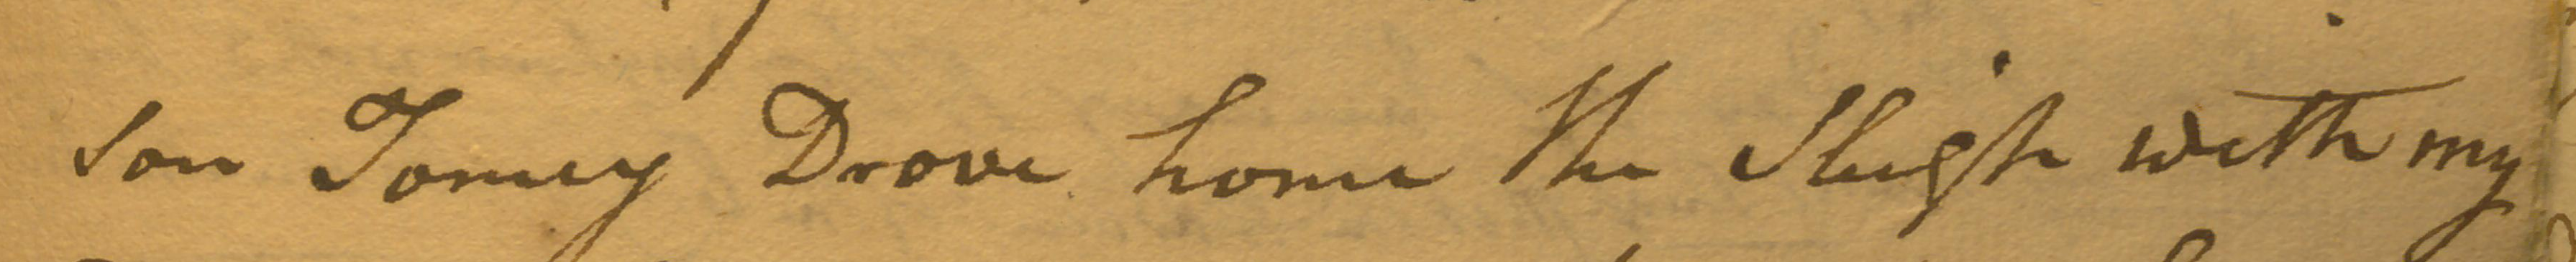Son Tomey Drove home the Sleigh with my
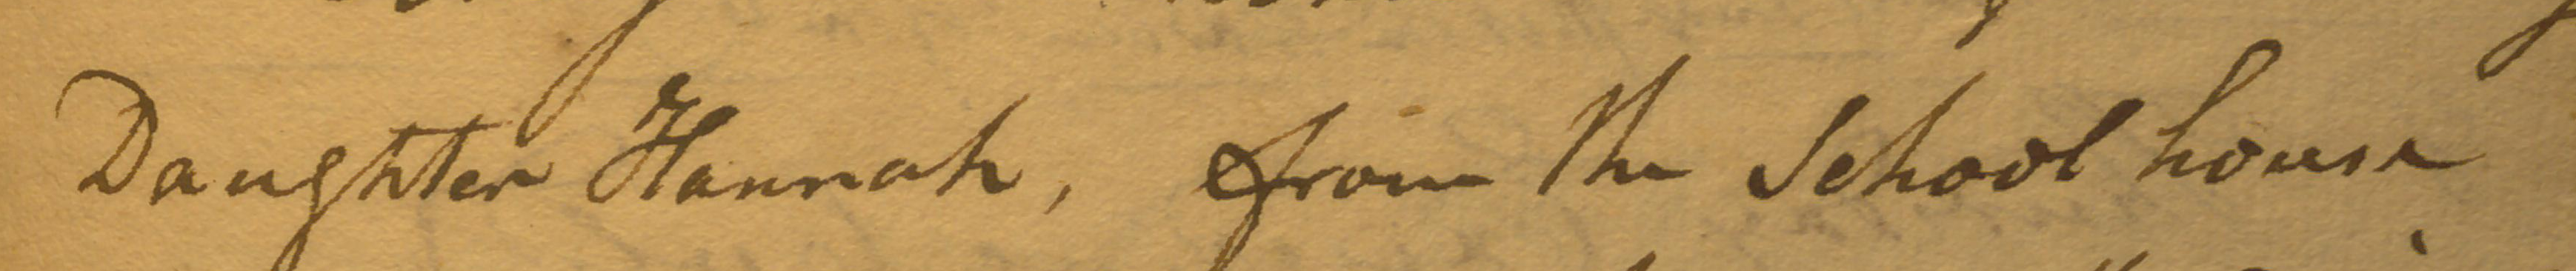Daughter Hannah, from the School house
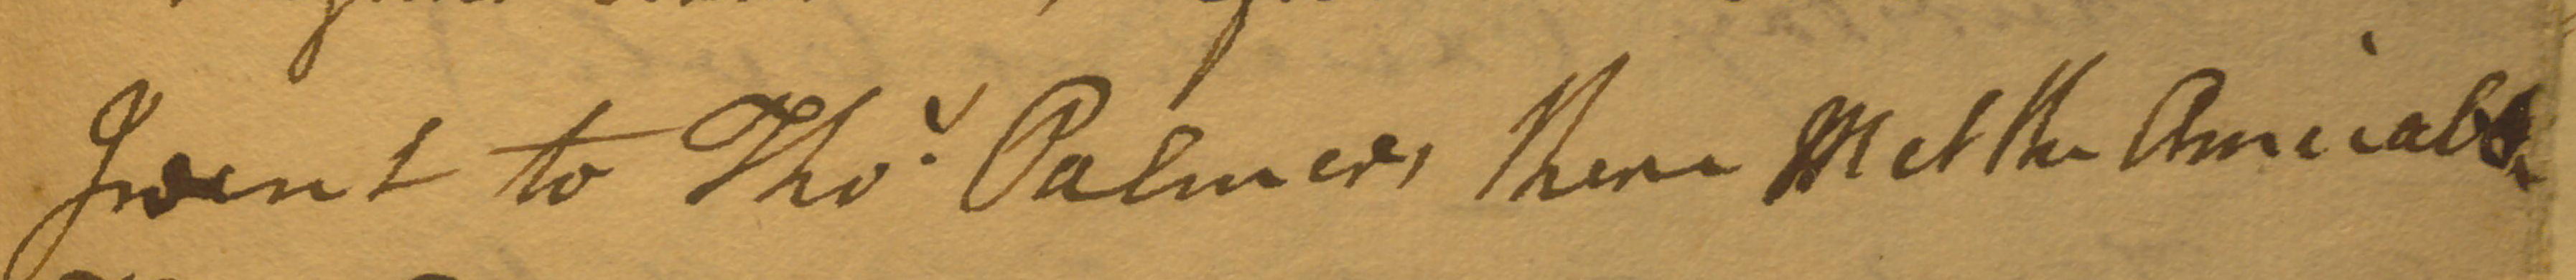I went to Tho^s. Palmers there Met the Amicable
